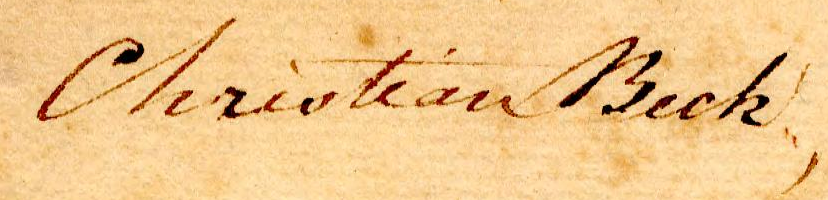Christian Beck
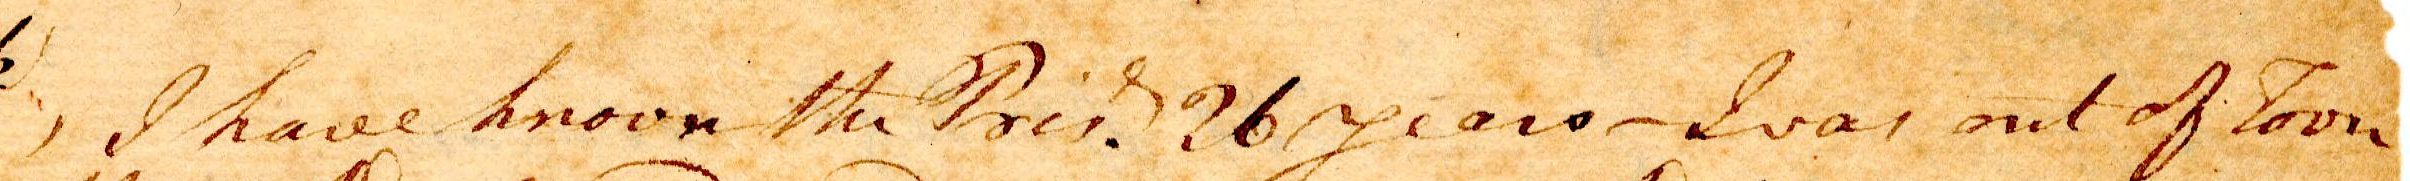I have known the Pris. 26 years- I was out of Town
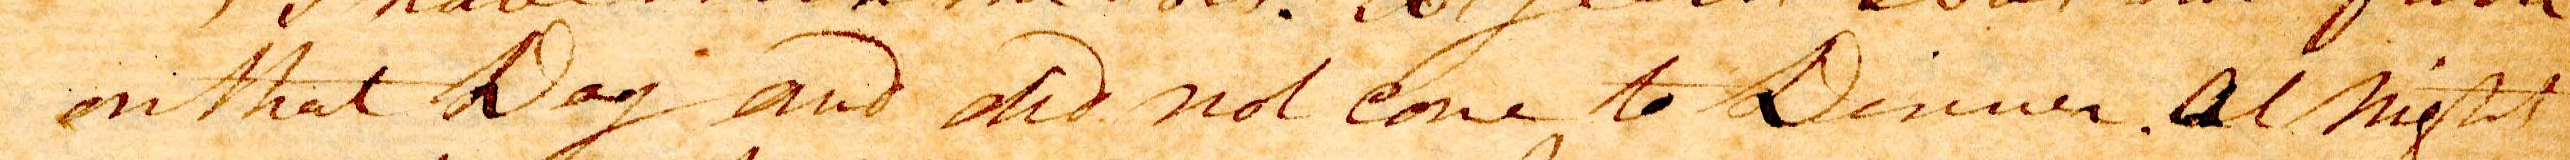on that Day and did not come to Dinner. At night
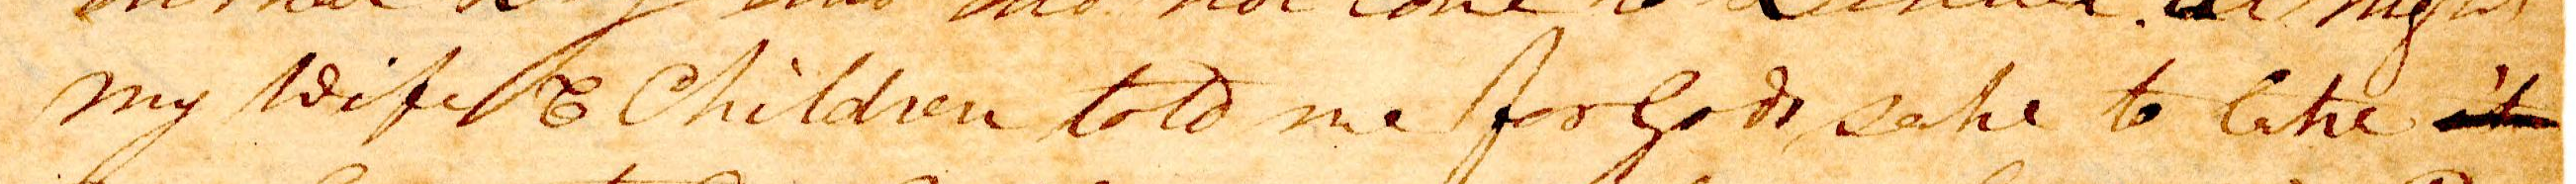my Wife & Children told me for Gods sake to take [it]
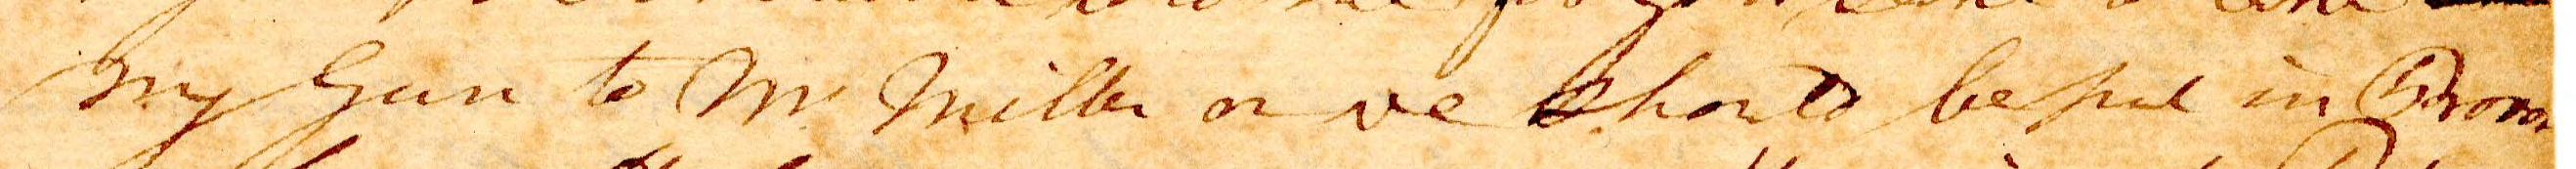my Gun to M^r Miller or we should be put in [___]
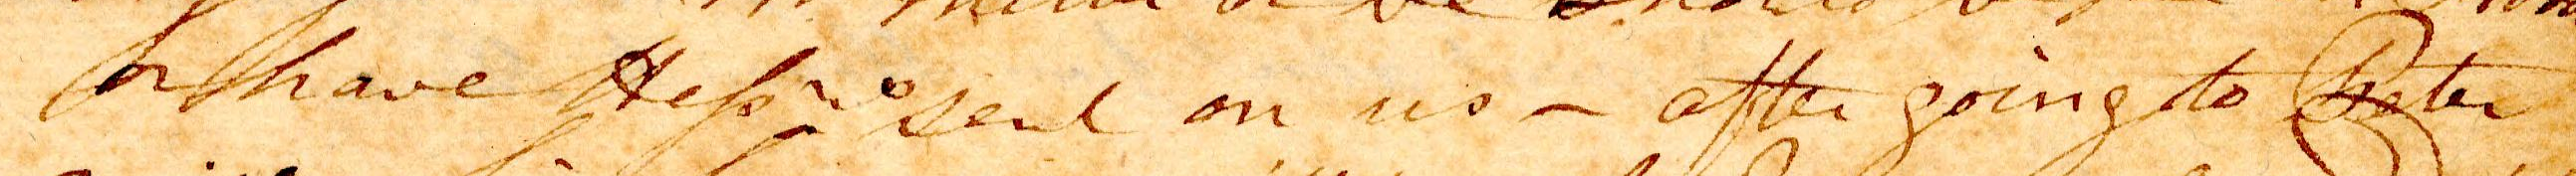or have Hess^ns sent on us- After going to Peter
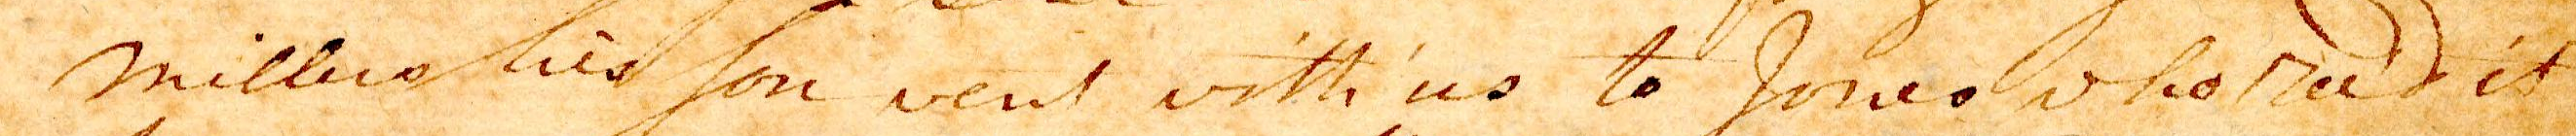Millers his son went with us to Jones who rec'd it
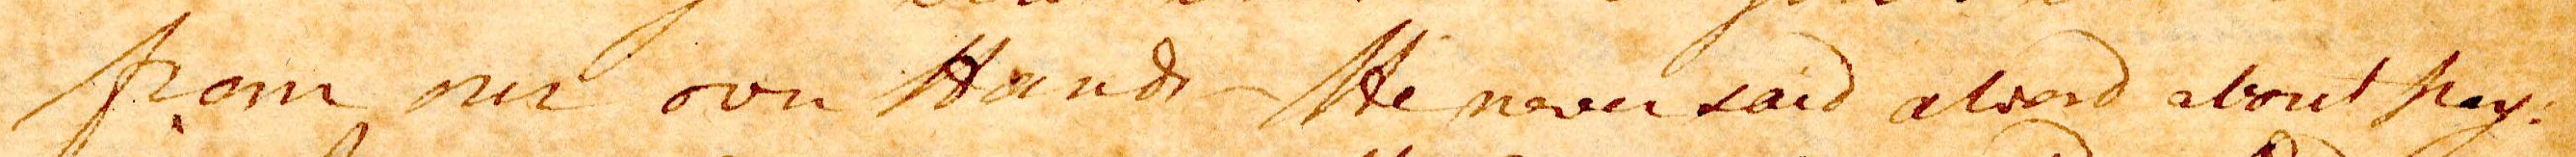from our own Hands- He never said a word about pay-
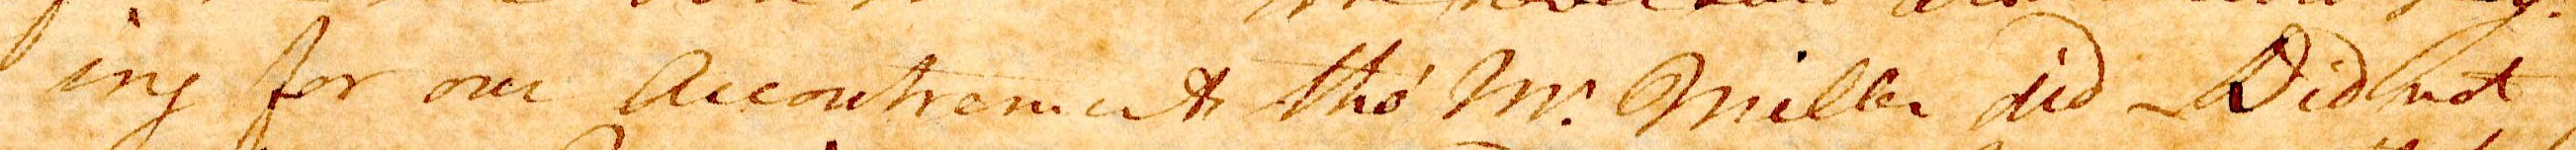ing for our Accoutrements tho' M^r Miller did- Did not
